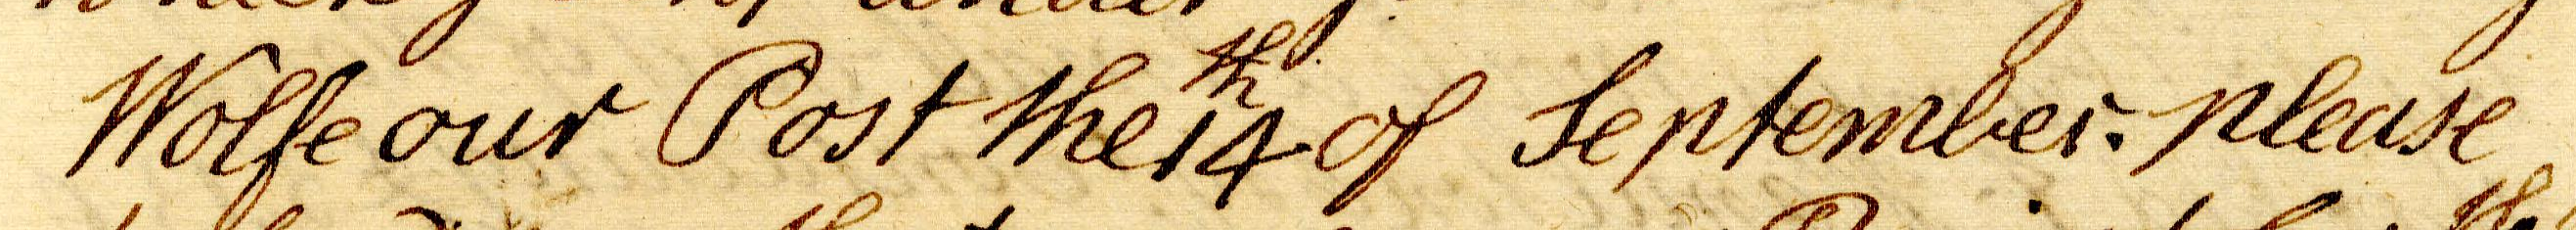Wolfe our Post the 14^th of September please
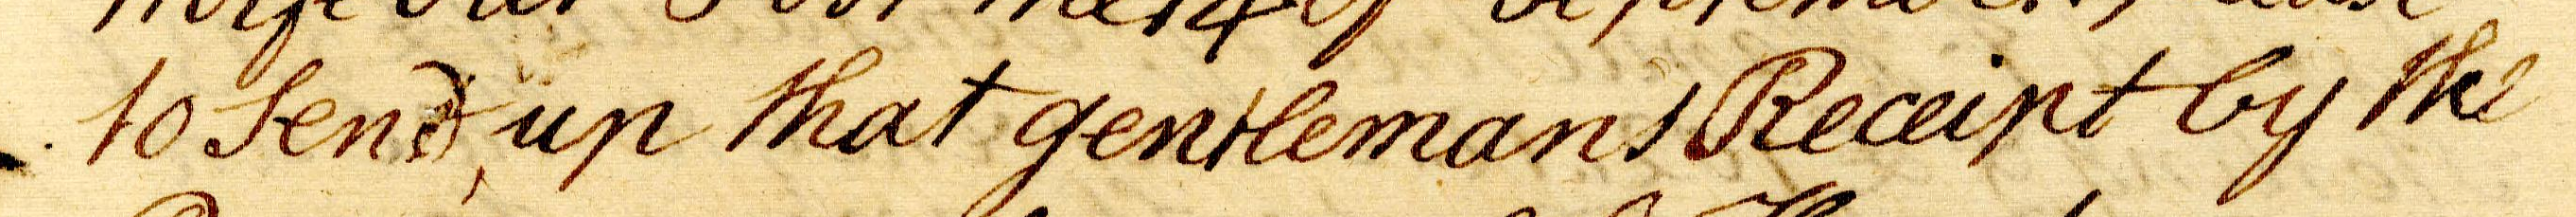to Send, up that gentlemans Receipt by the
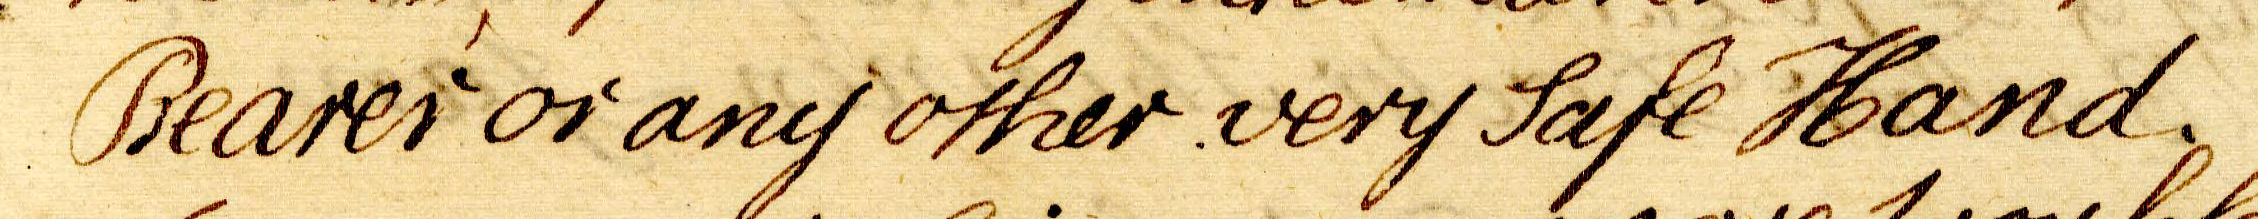Bearer or any other very Safe Hand.
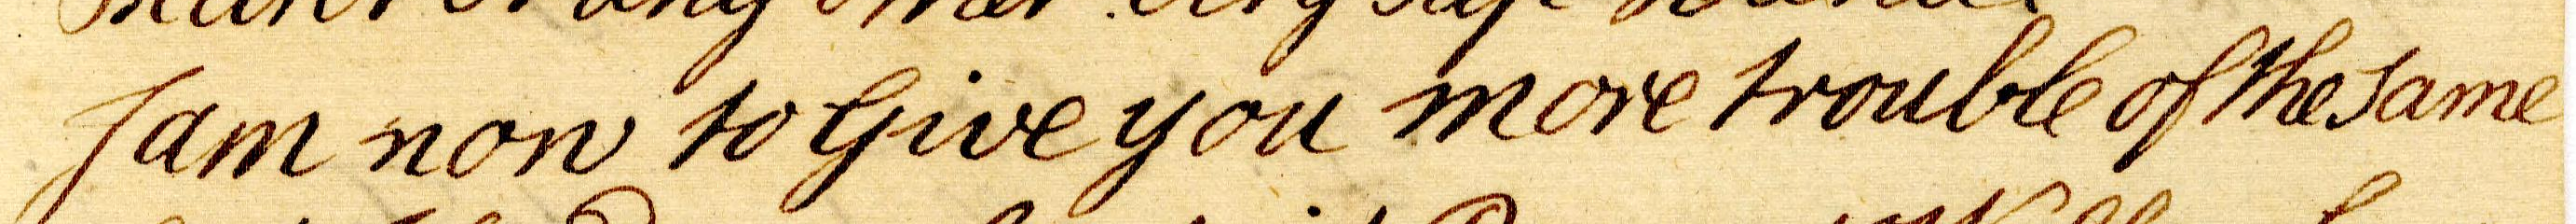I am now to Give you more trouble of the Same
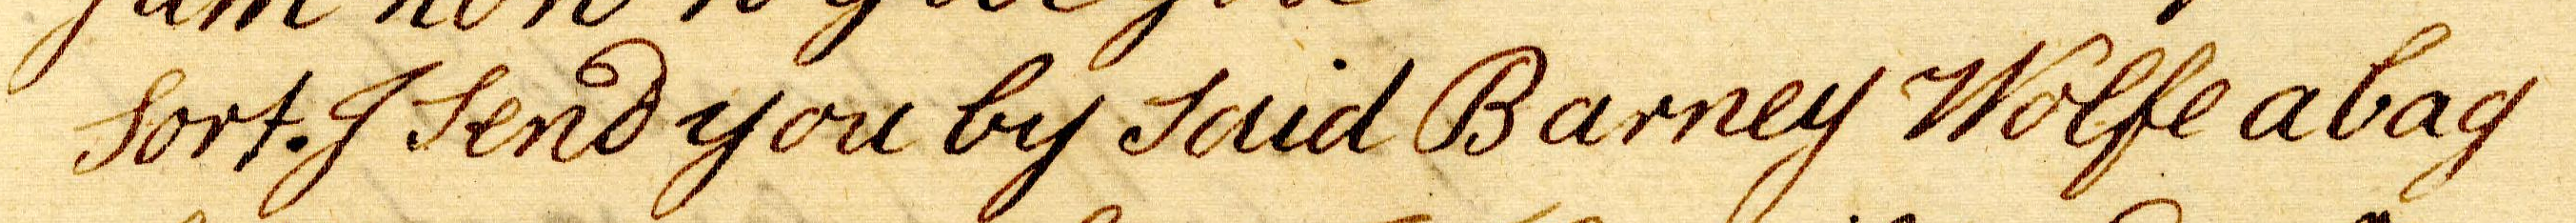Sort. I send you by said Barney Wolfe a bag
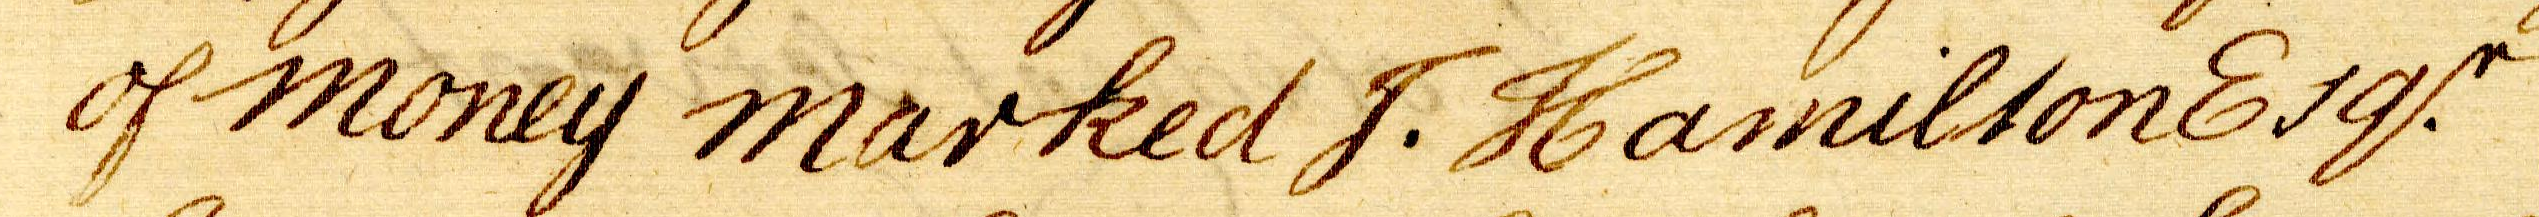of Money Marked J. Hamilton Esq^r.
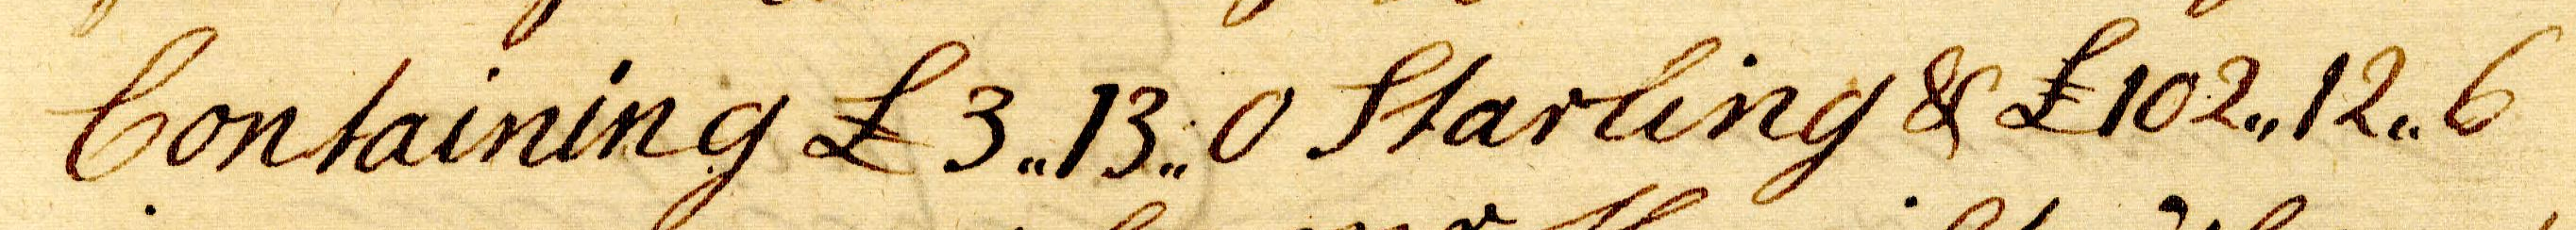Containing £3..13..0 Starling & £102..12..6
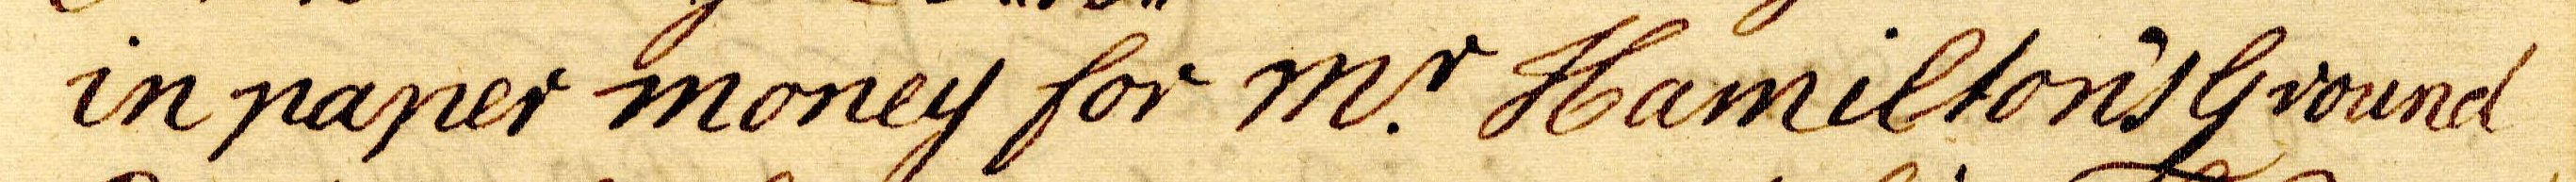in paper Money for M^r. Hamilton's Ground
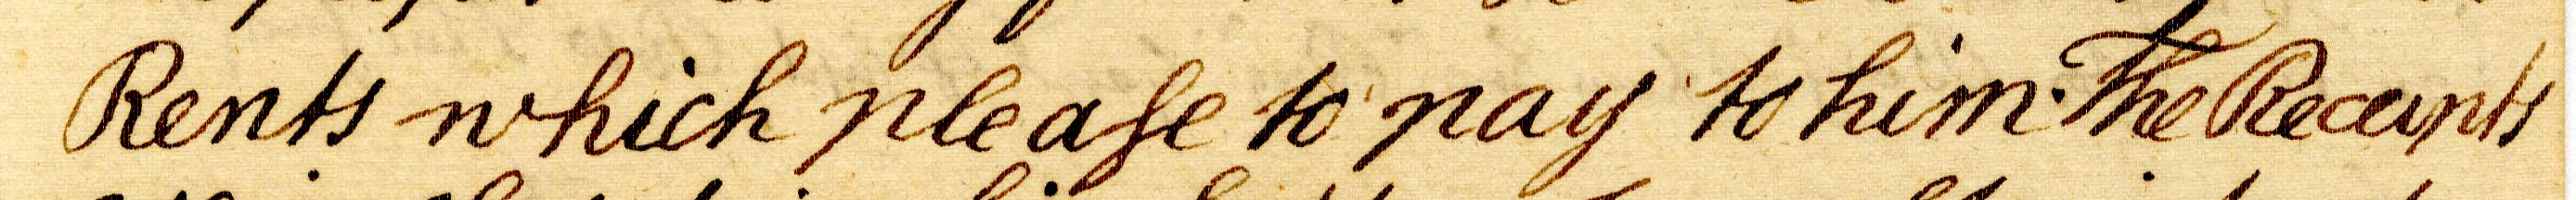Rents which please to pay to him the Receipts
